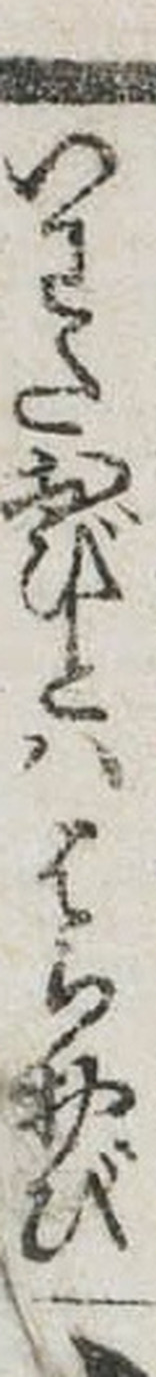いわたおびとははらおび
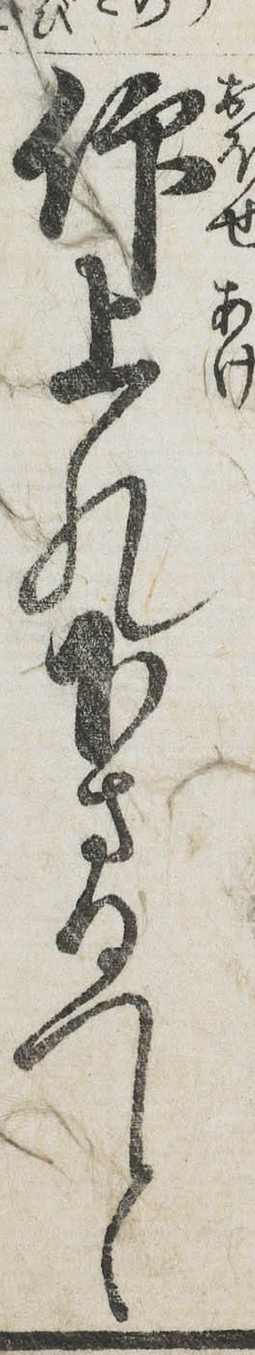仰上れ下さるへく候
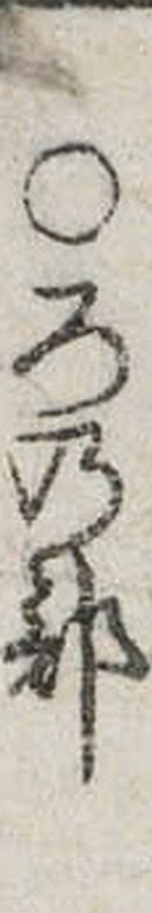○ろの部
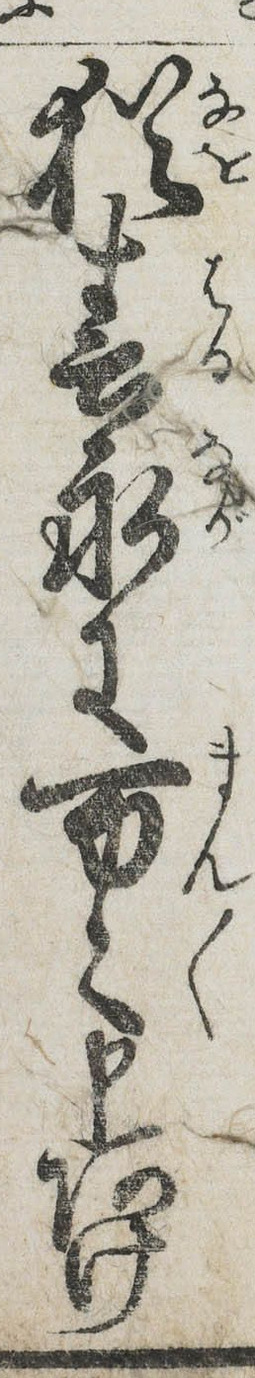猶春永に万々申あけ
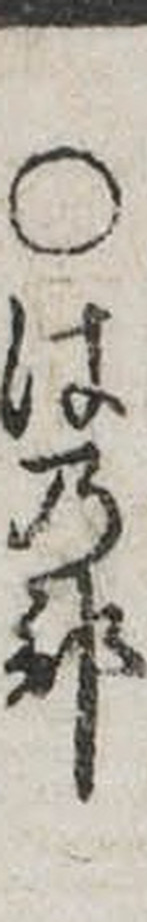○はの部

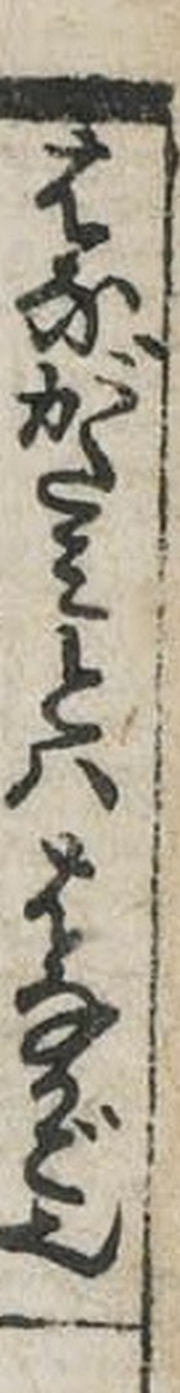はながたみとははなかご也
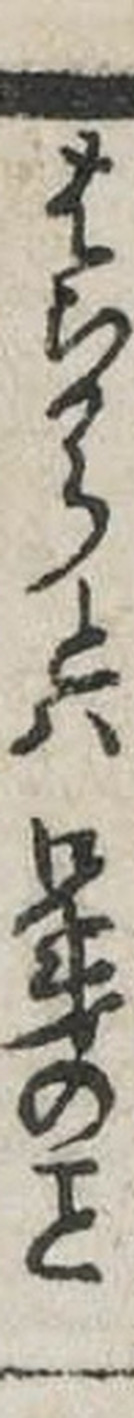はらからとは兄弟のこと
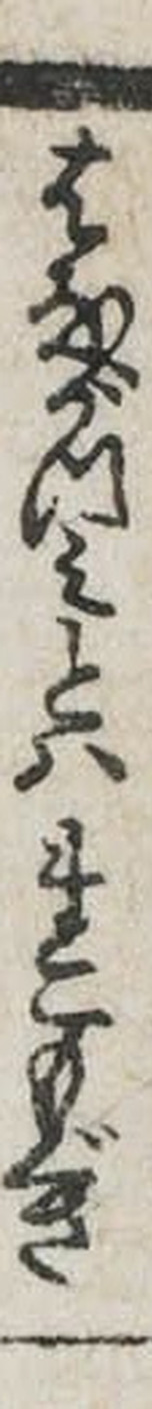はながつみとはまこもぐさ
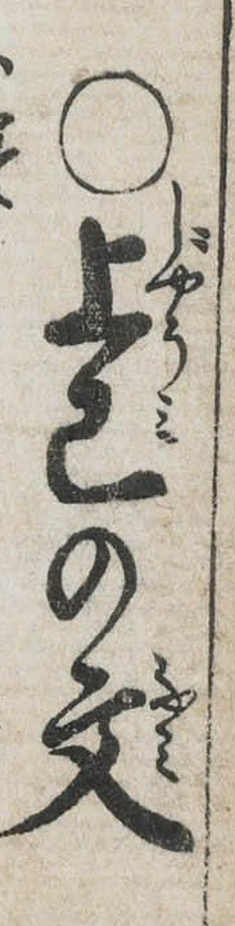○上巳の文
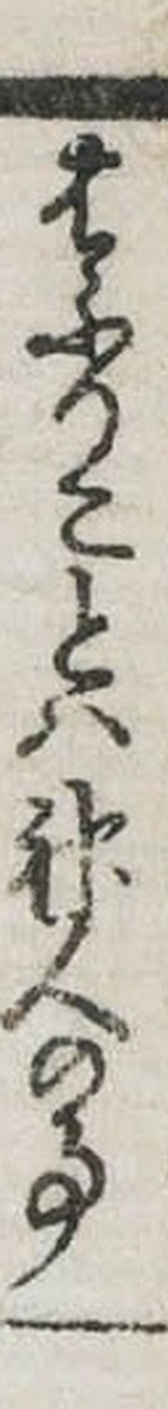はふりことは神人の事
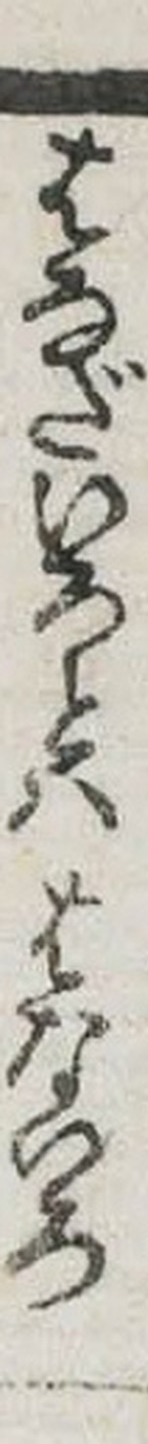はなだいろとははないろ
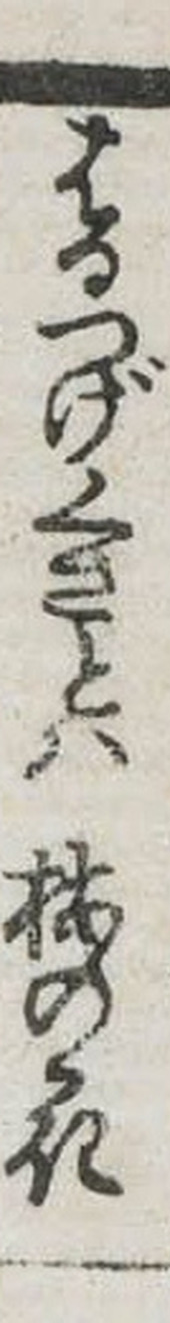はるつげくさとは梅の花
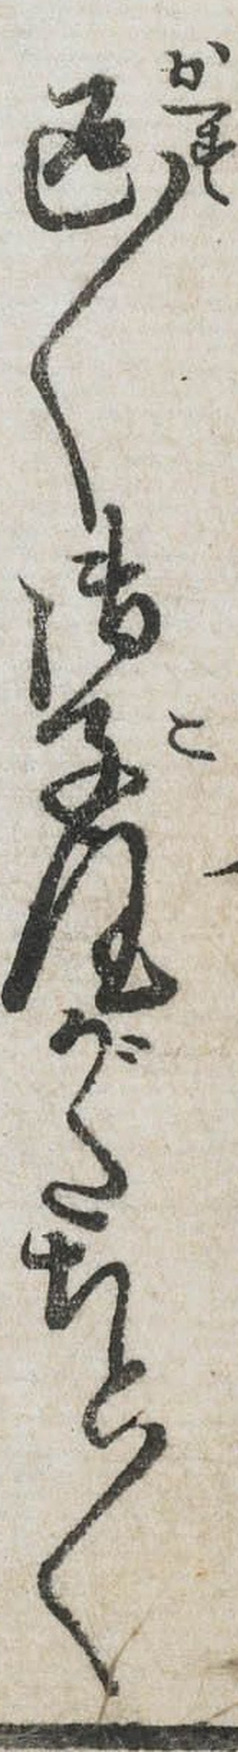返〳〵御子さまがたちと〳〵
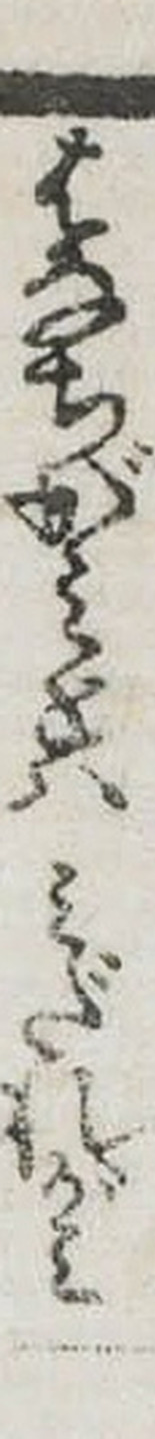はなちがみとはみだれがみ
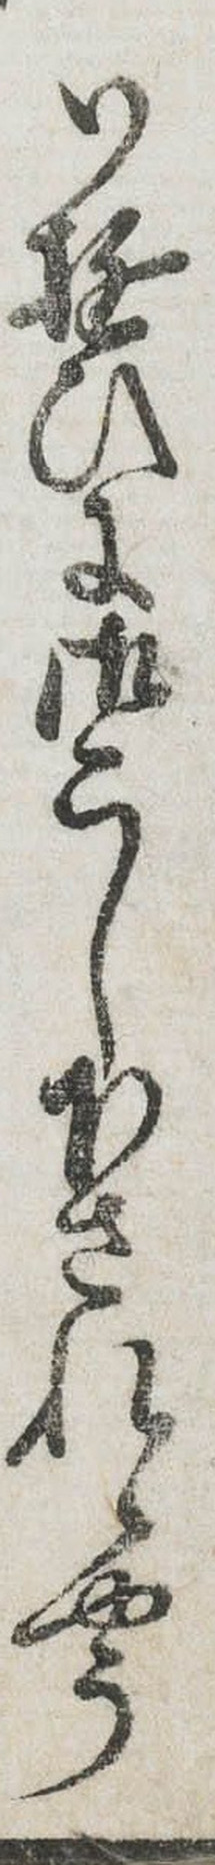御遊ひに御こし下され候やう
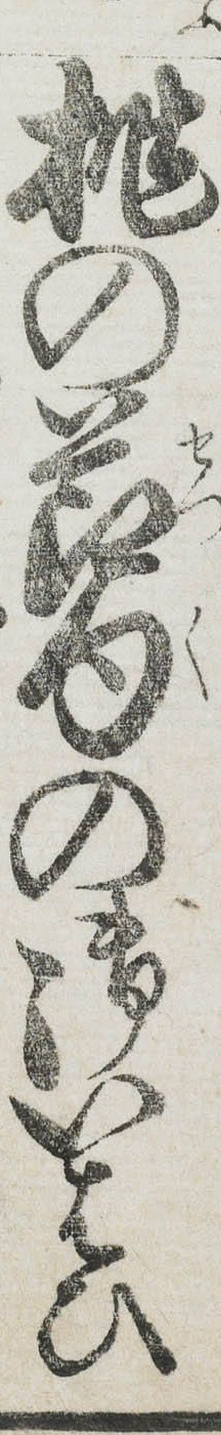桃の節句の御いはひ
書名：頭書萬用婦人手紙之文言
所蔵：東京学芸大学教育コンテンツアーカイブ
